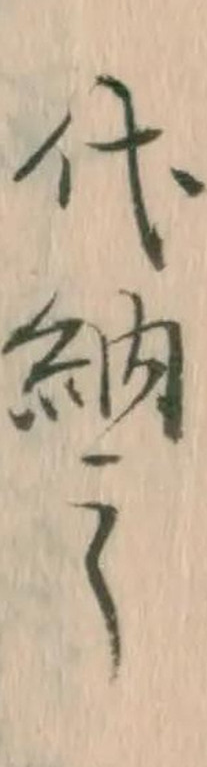代納之
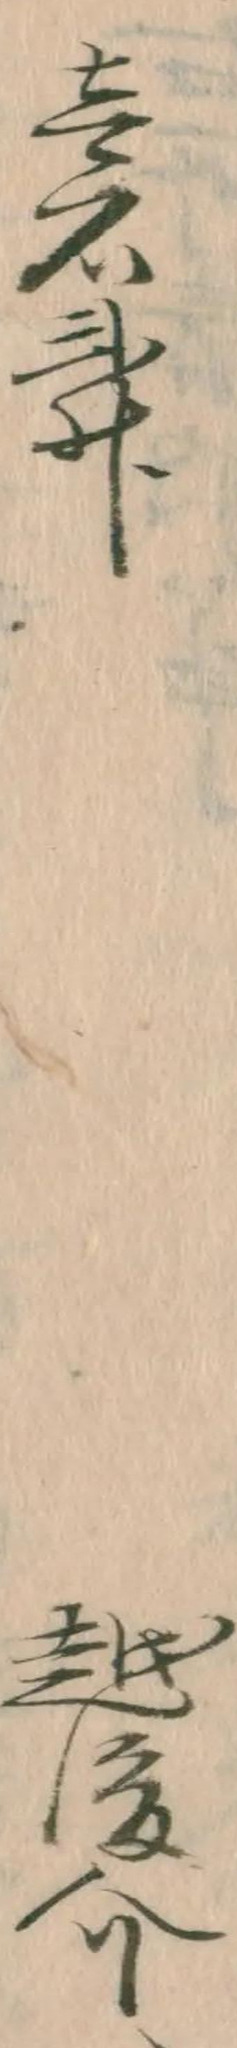壱石弐升越後介ヘ
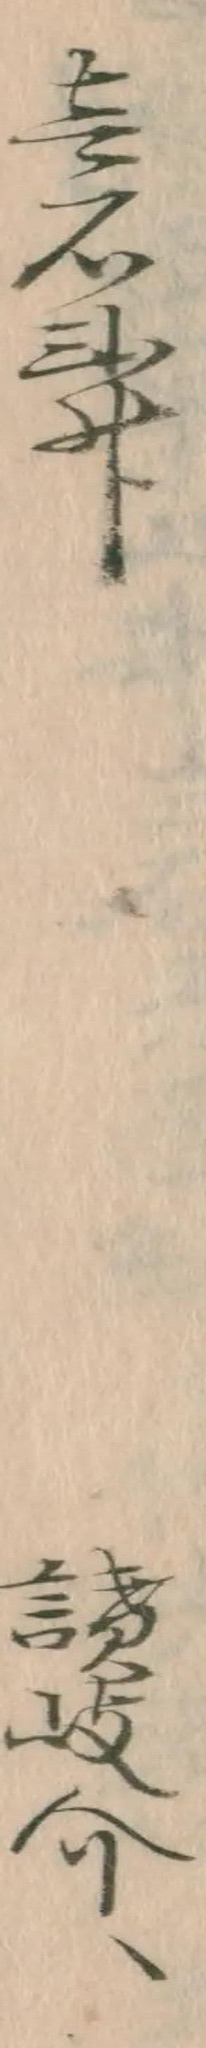壱石弐升讃岐介へ
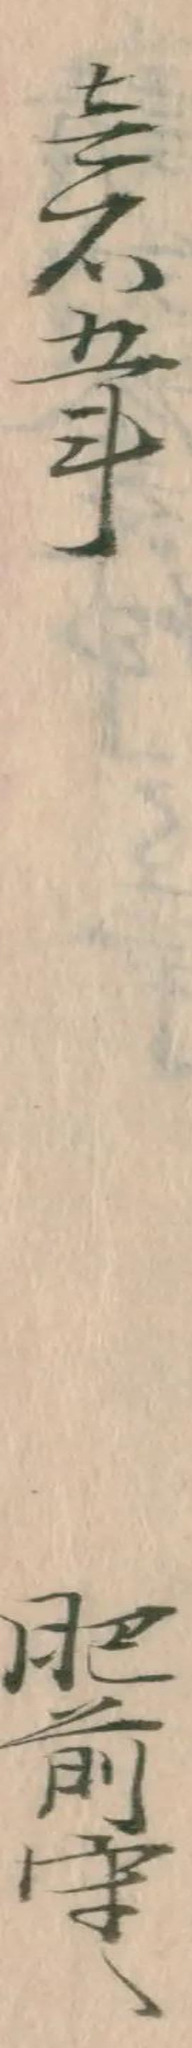壱石五斗肥前守へ
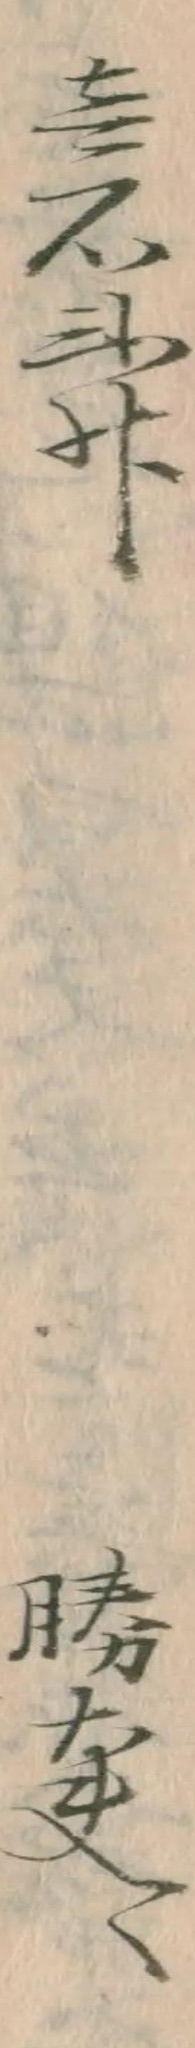壱石弐升勝大夫へ
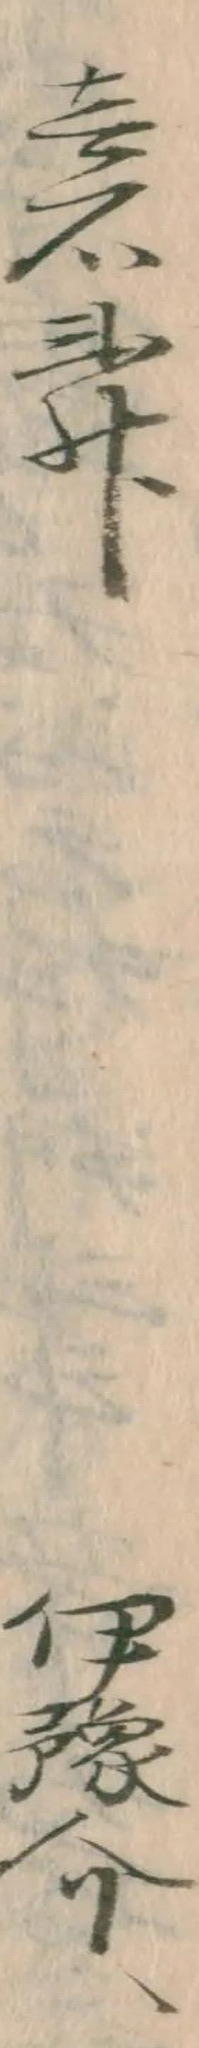壱石弐升伊豫介へ
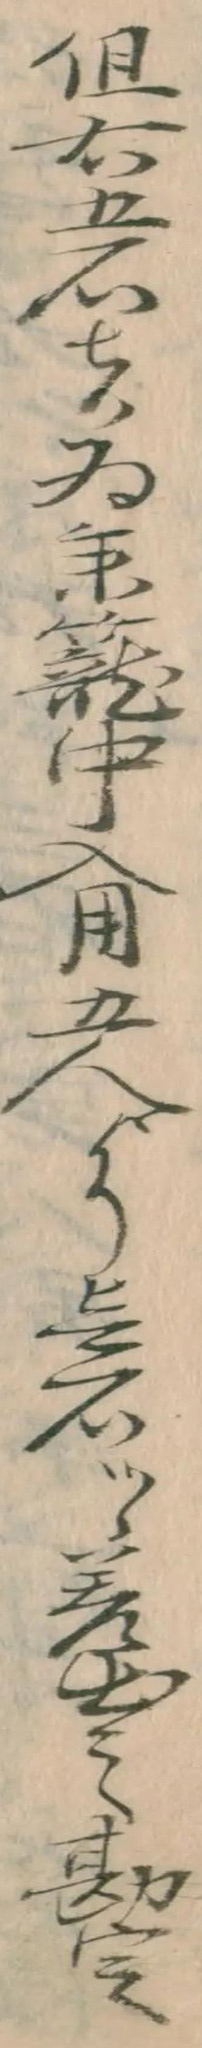但右五石は為参籠中入用五人より壱石ツヽ差出之勘定
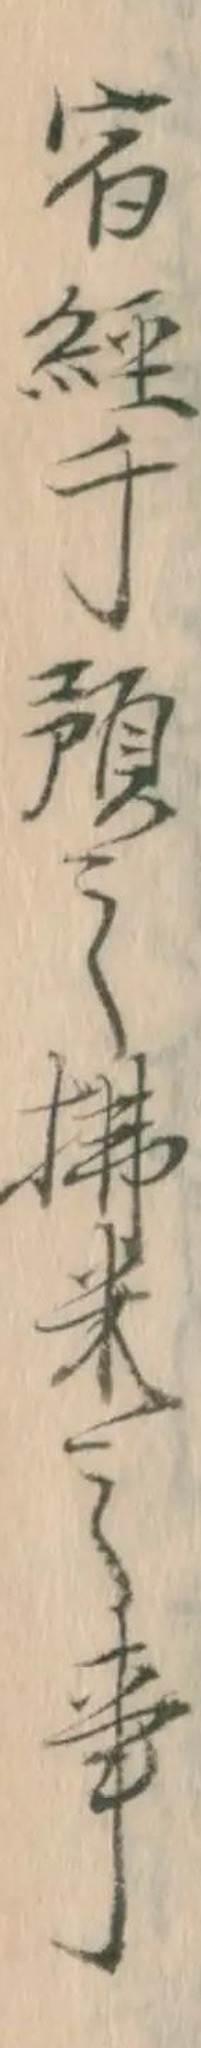宿経千預之払米之事

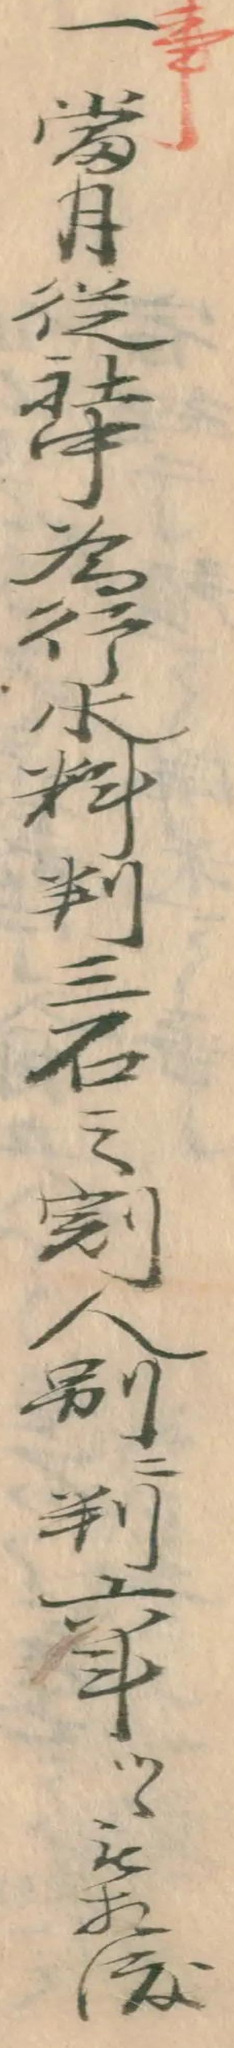一當月従社中為行水料判三石之割人別ニ判六斗ツヽ被相渡
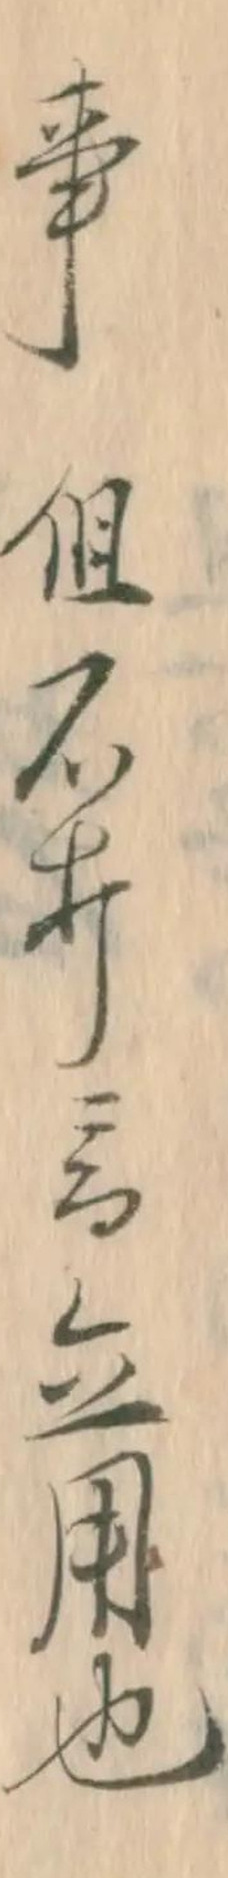事但石打ニ而立用也
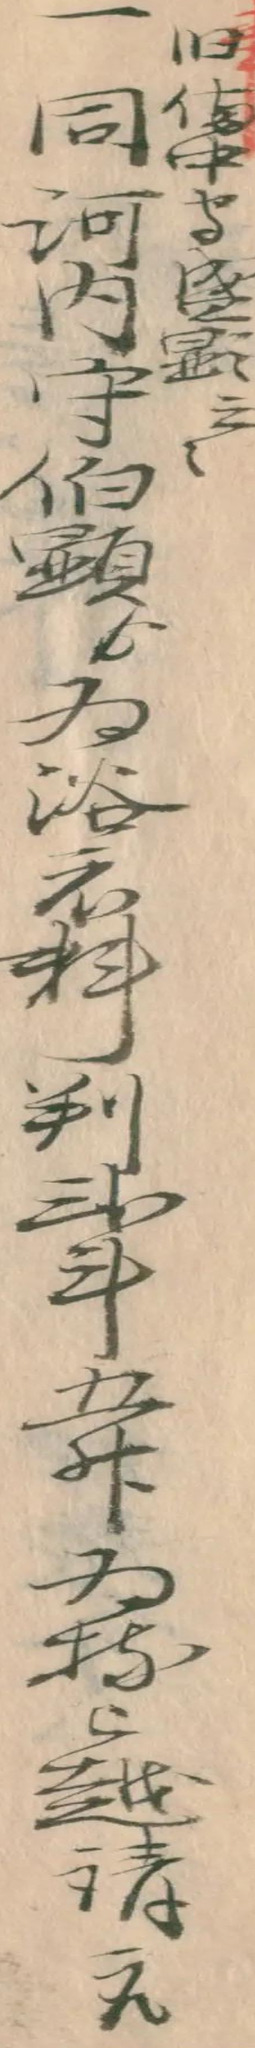一同河内守伯頭ゟ為浴衣料判弐斗五升為持被越請取
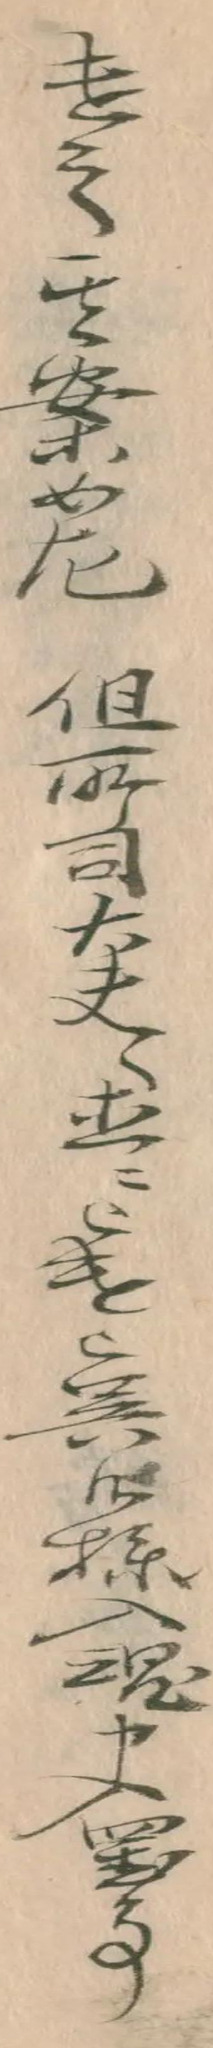遣之其案如左但所司大夫へ直ニ被遣被呉御様入魂申入置事
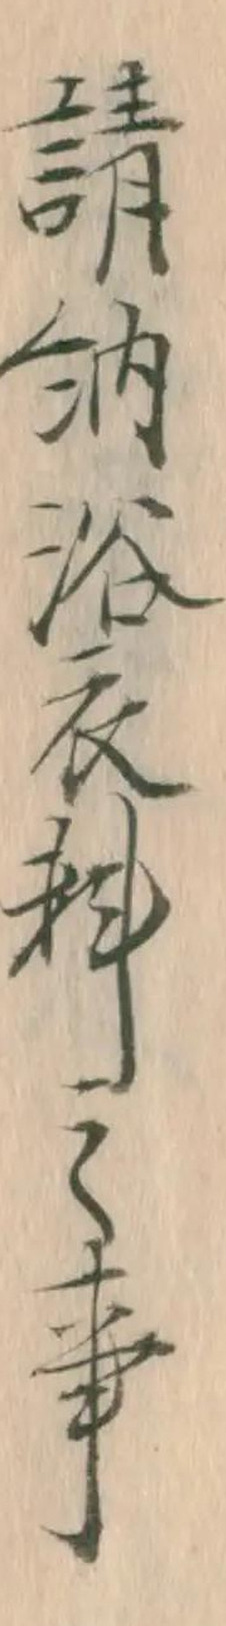請納浴衣料之事
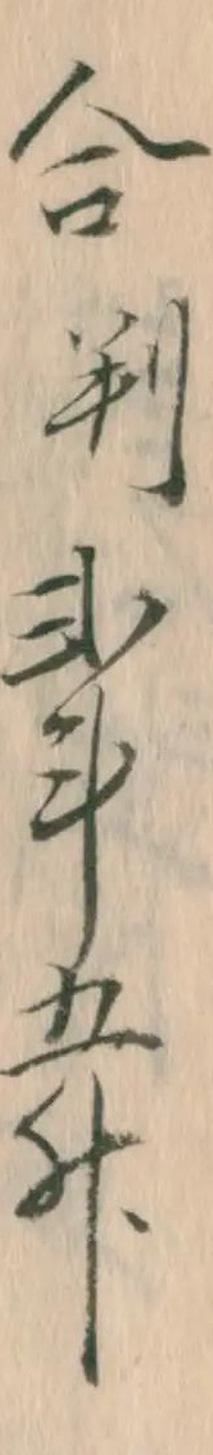合判弐斗五升
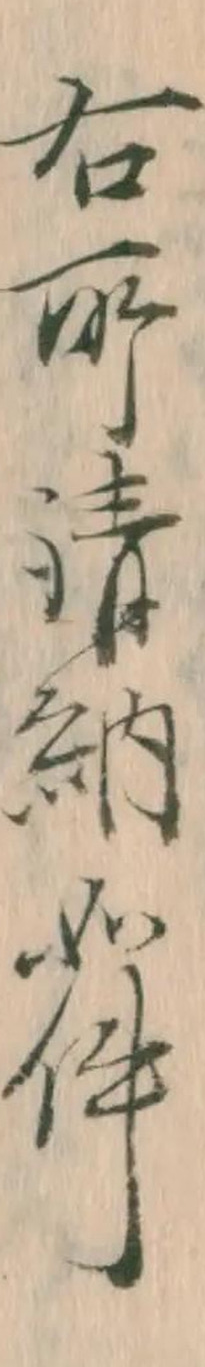右所請納如件
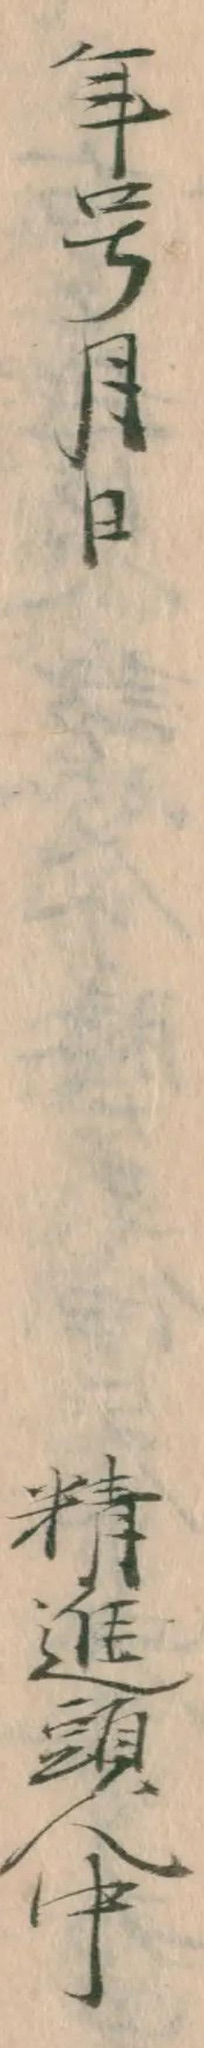年号月日精進頭人中
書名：賀茂社記録. 第74冊
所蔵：国立国会図書館 National Diet Library, JAPAN
